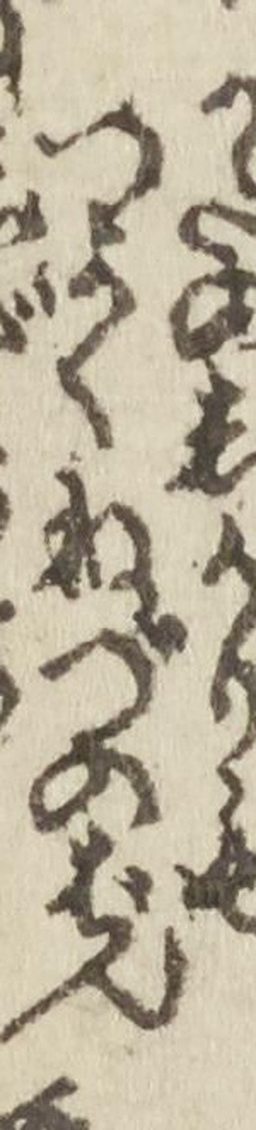つよくねずのばん
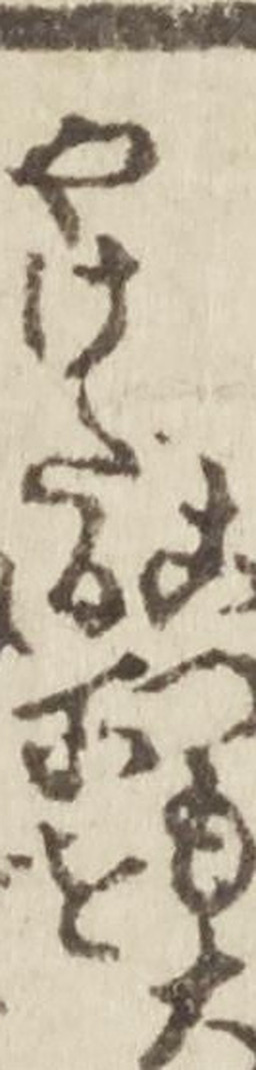やけたる所を
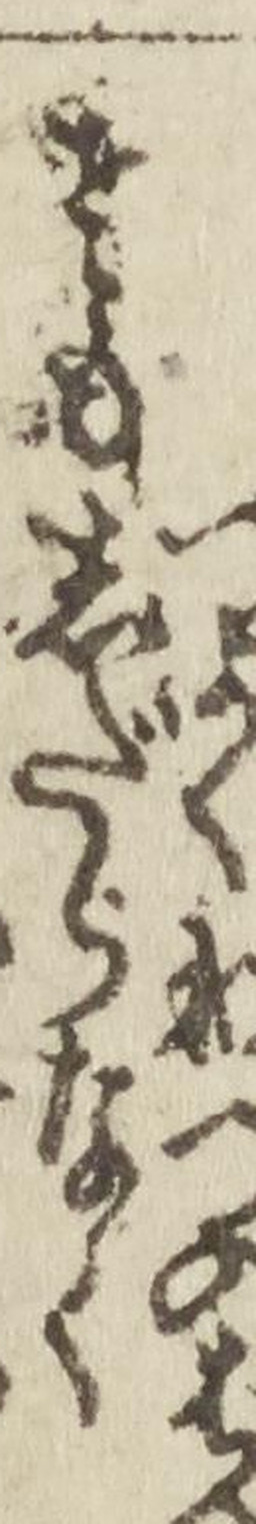さもしだらなく
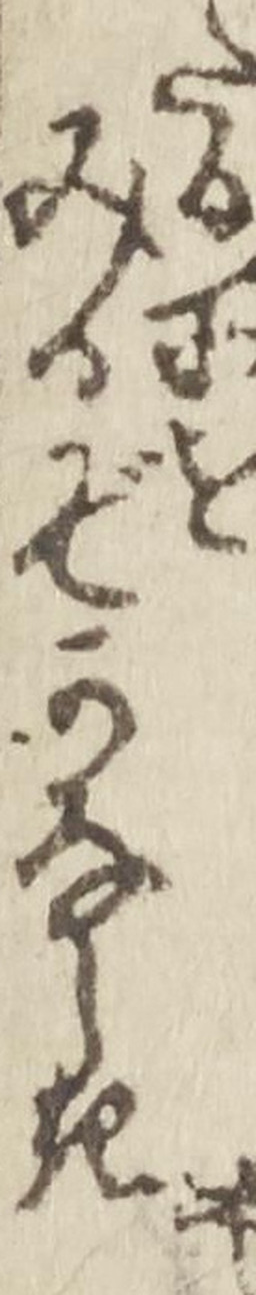みるぞかなしき
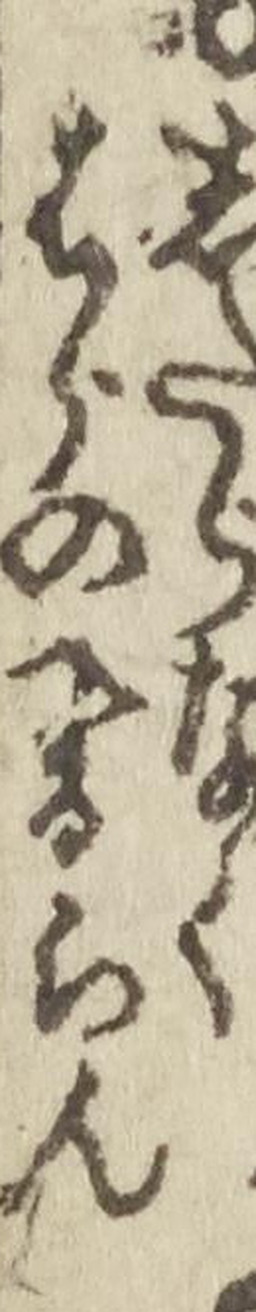はらのへるらん

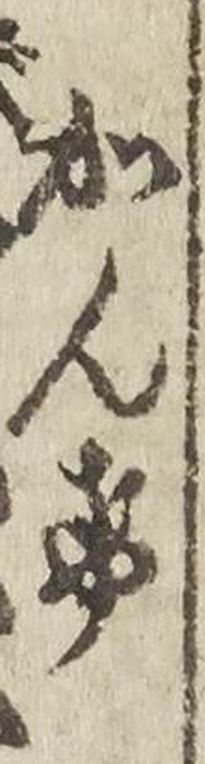かんけ
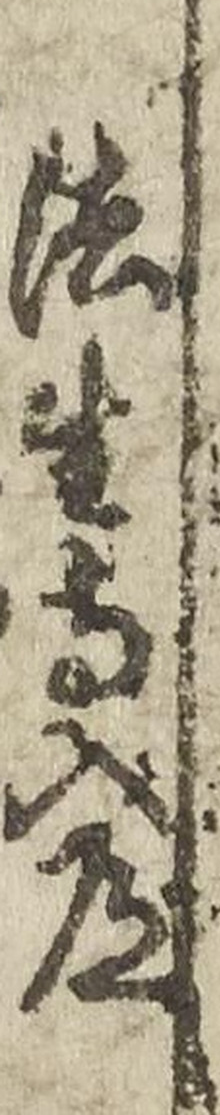法生寺入道
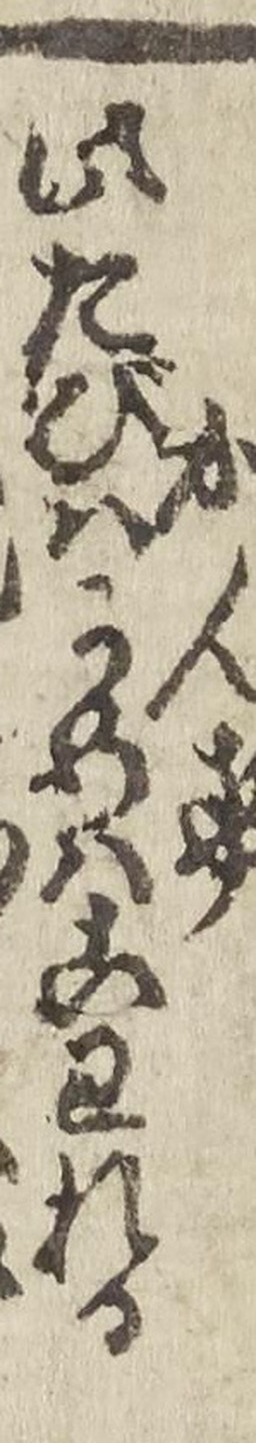此たびはかめはこわれる
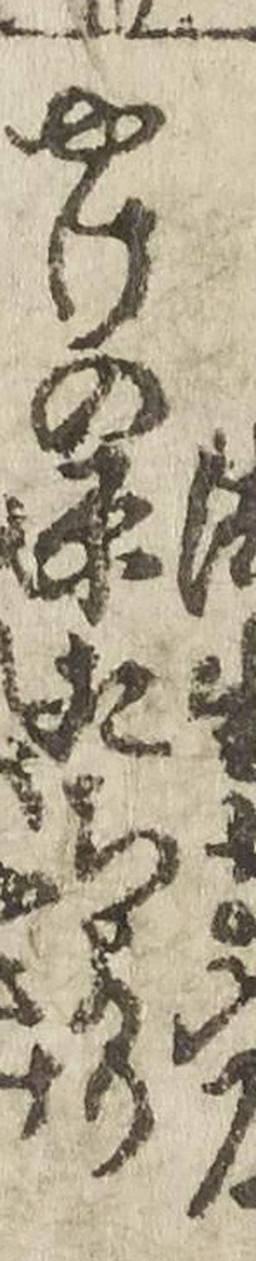やけの原たちより
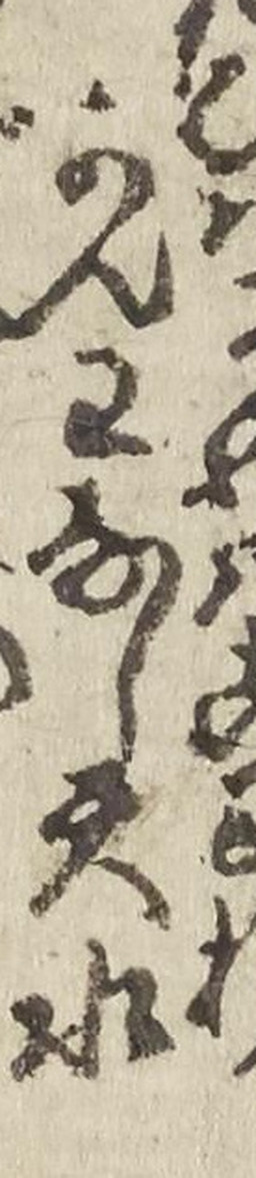かんわなし天水
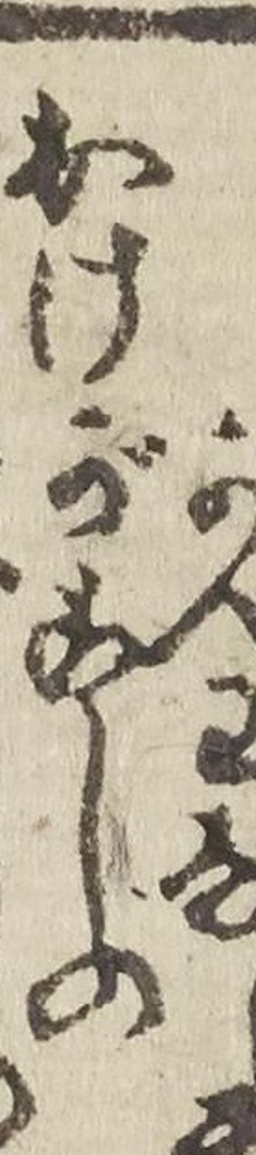おけがこしの
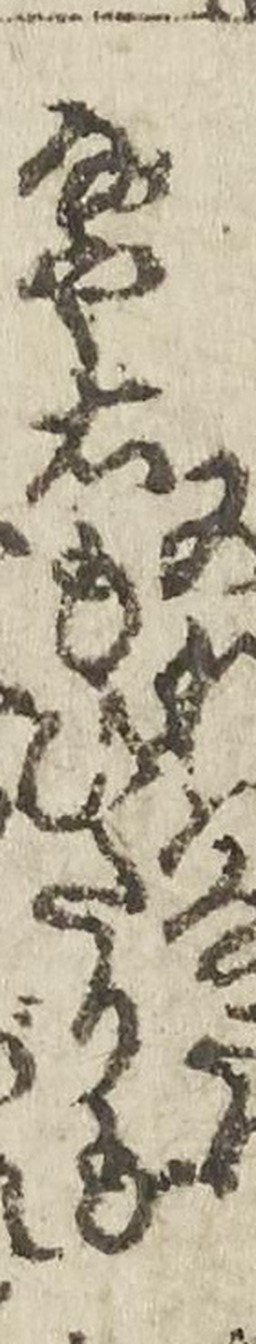なや右もひたりも
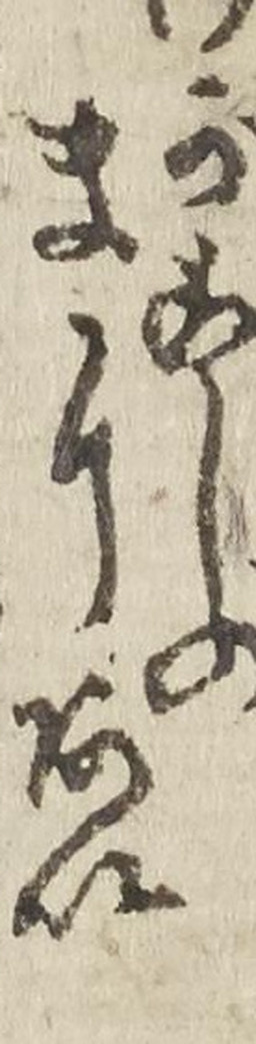まにあい
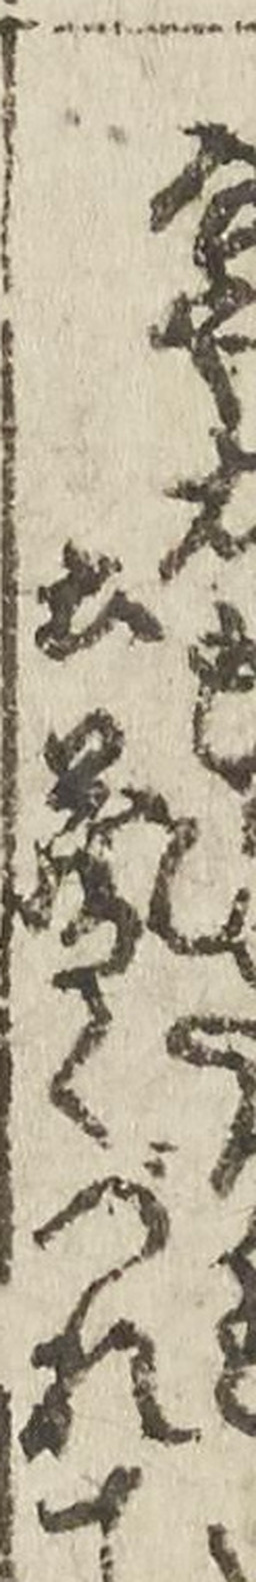土蔵くづれて
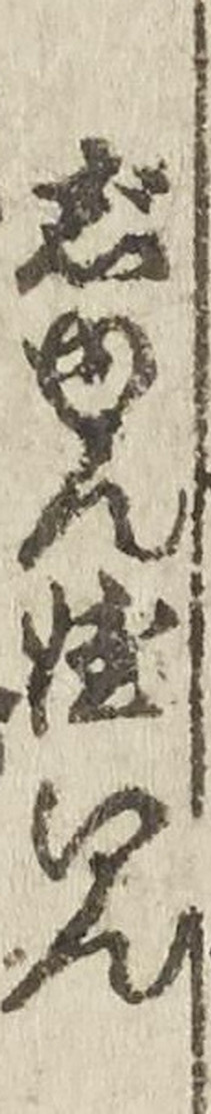じゆん徳いん
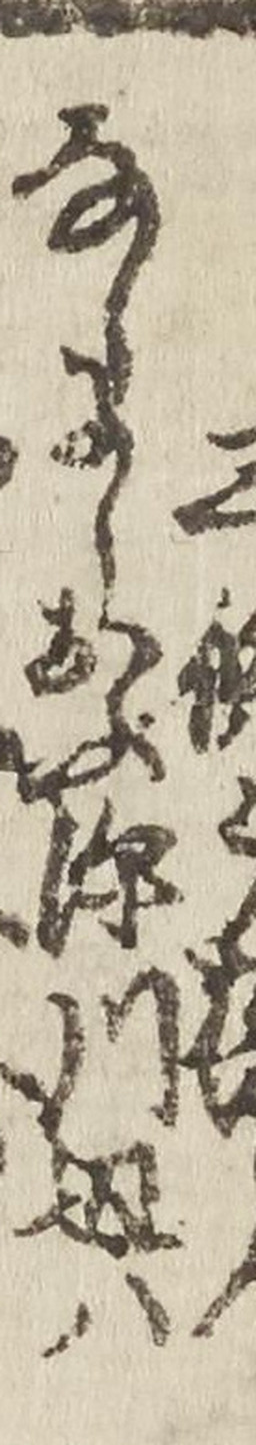なしにしおふ深川辺は
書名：しんぱん三十六哥仙
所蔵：東京大学地震研究所図書室 Earthquake Research Institute Library, The University of Tokyo, JAPAN
